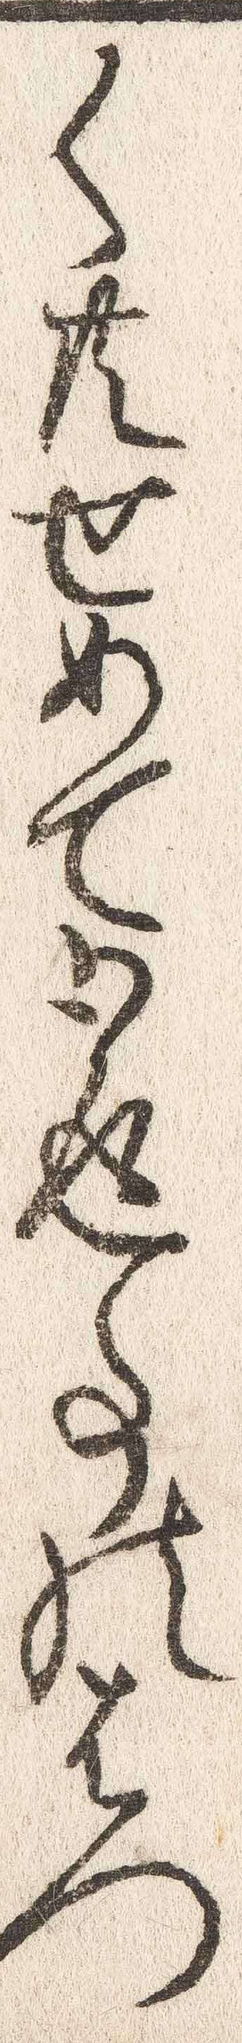く共せめて御返事のはつ

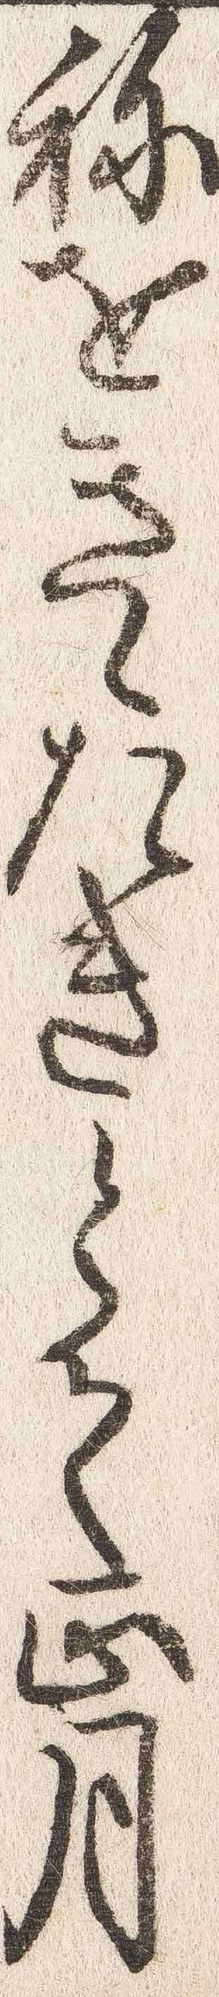ねをきゝたきとて正月
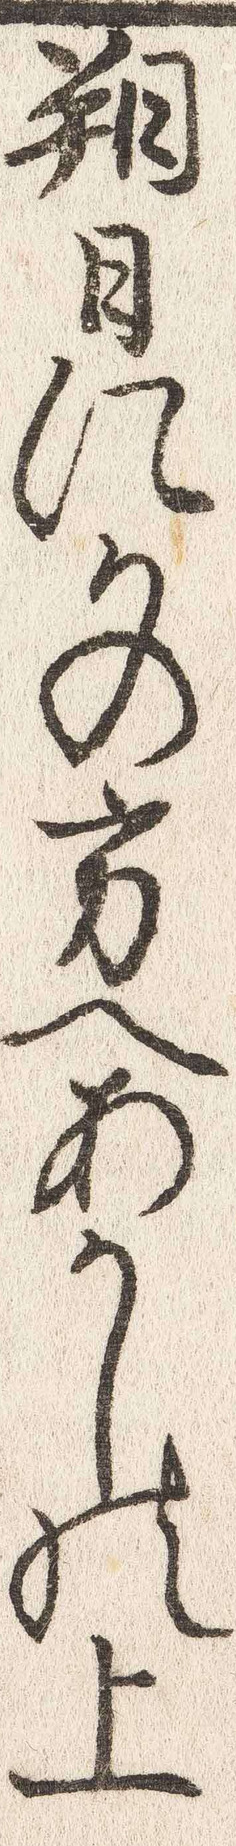朔日にかの方へあかしの上
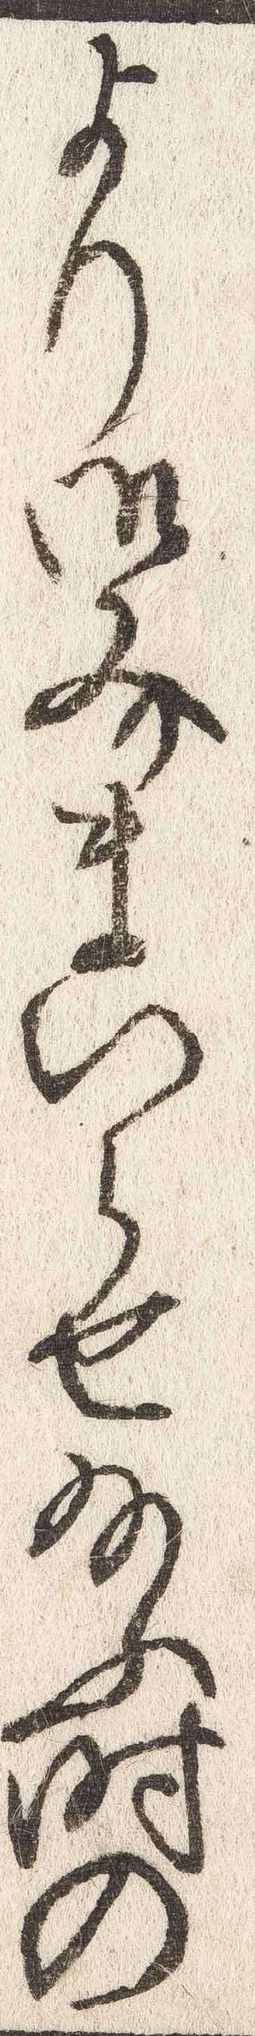より御文まいらせ給ふ時の
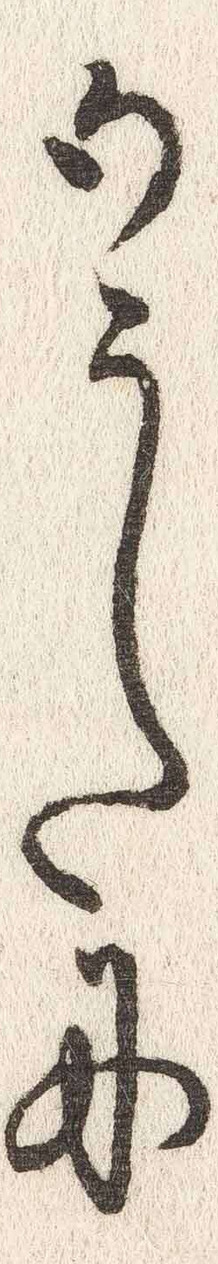御うたに
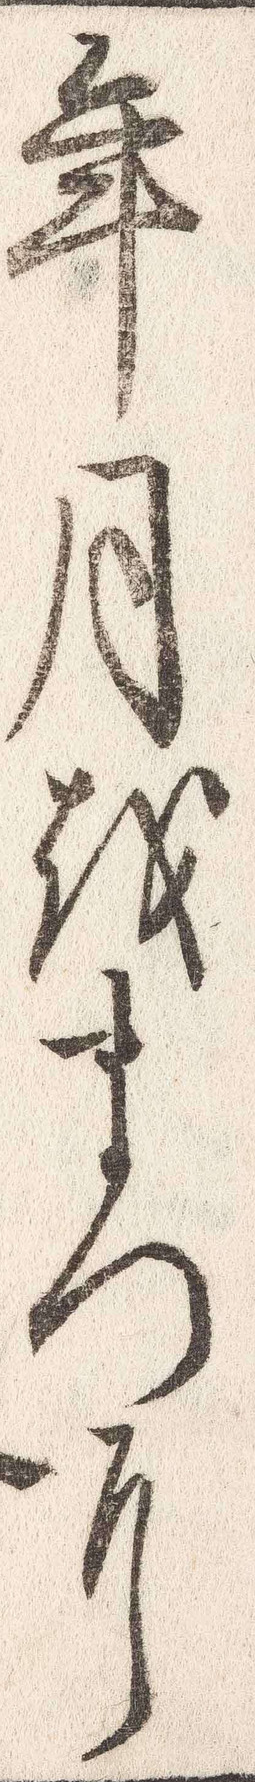年月をまつに
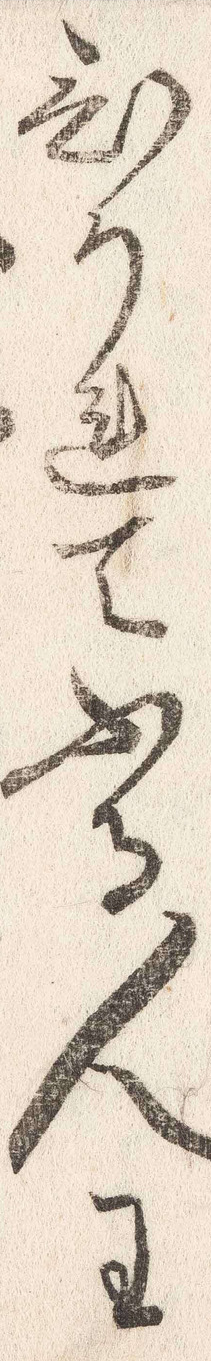ひかれてふる人わ
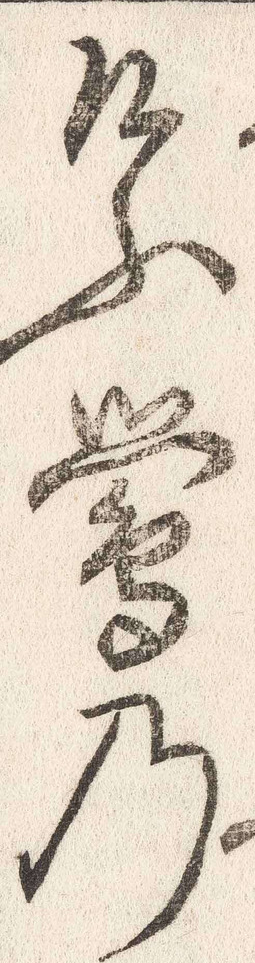けふ鶯の
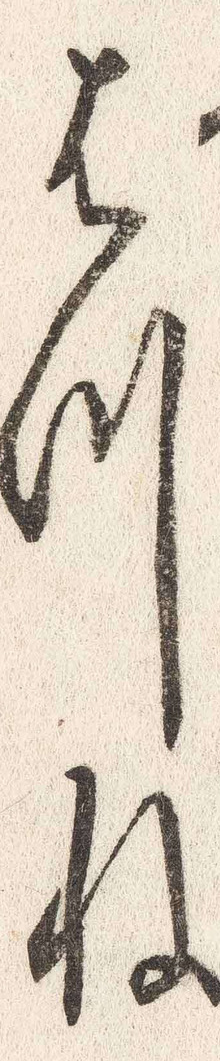はつね
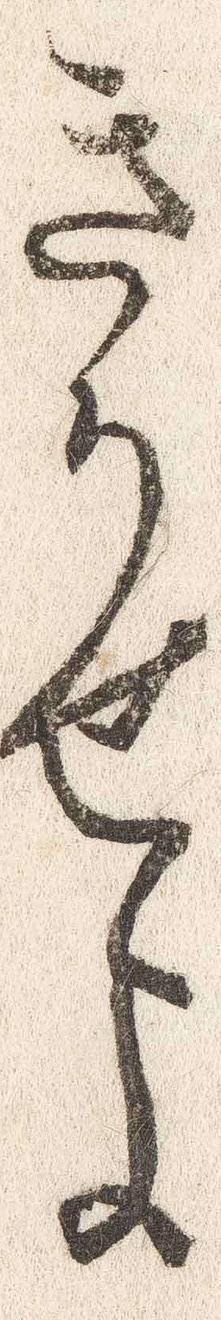きかせよ

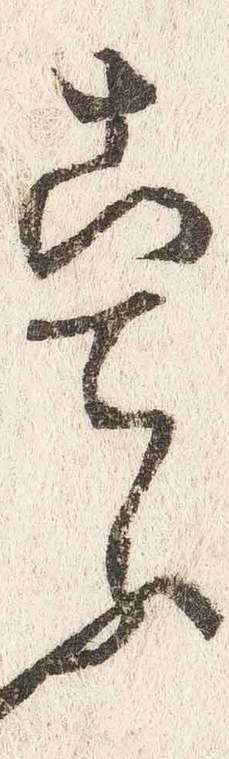こてふ
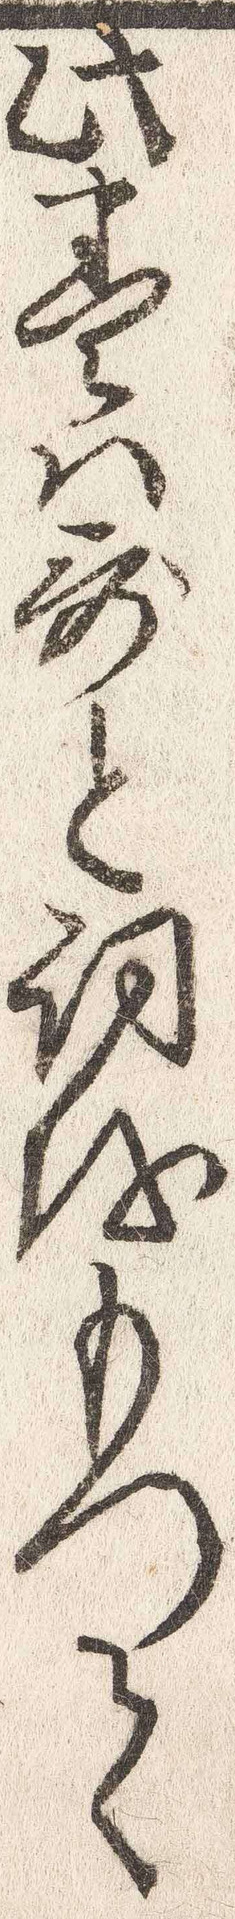此巻は歌と詞をもつて
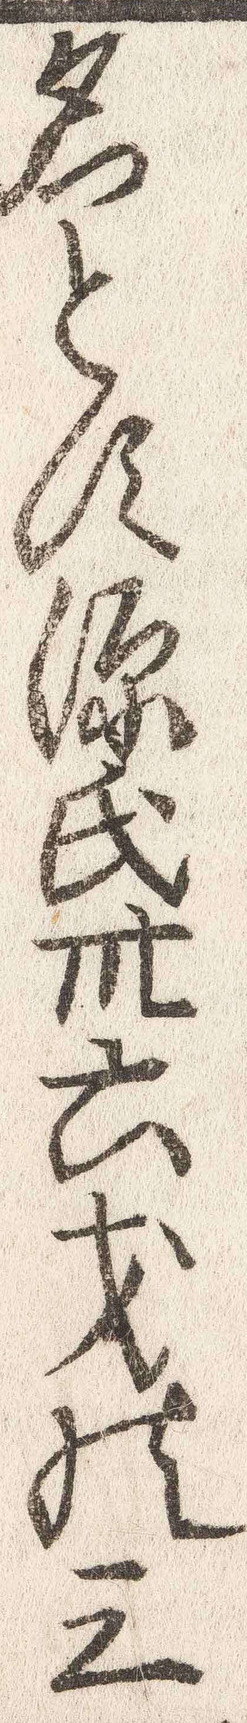名とす源氏卅六才の三
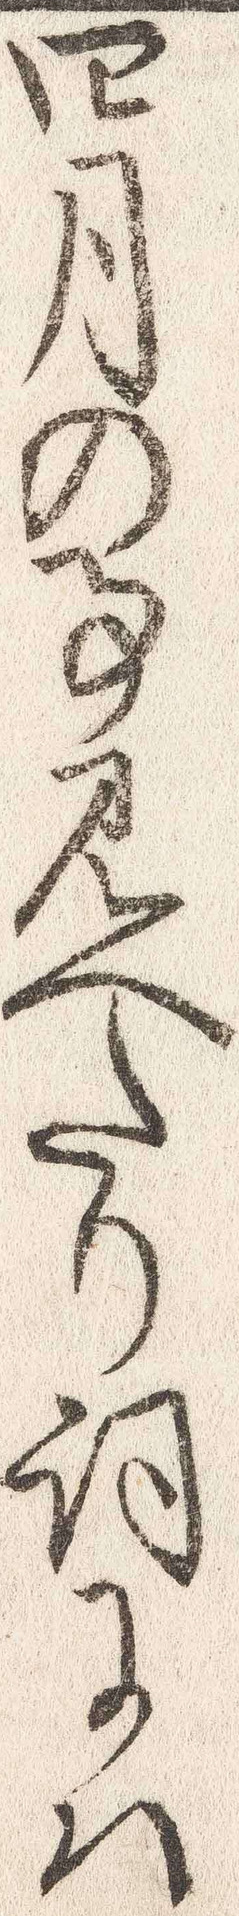四月の事見へたり詞には
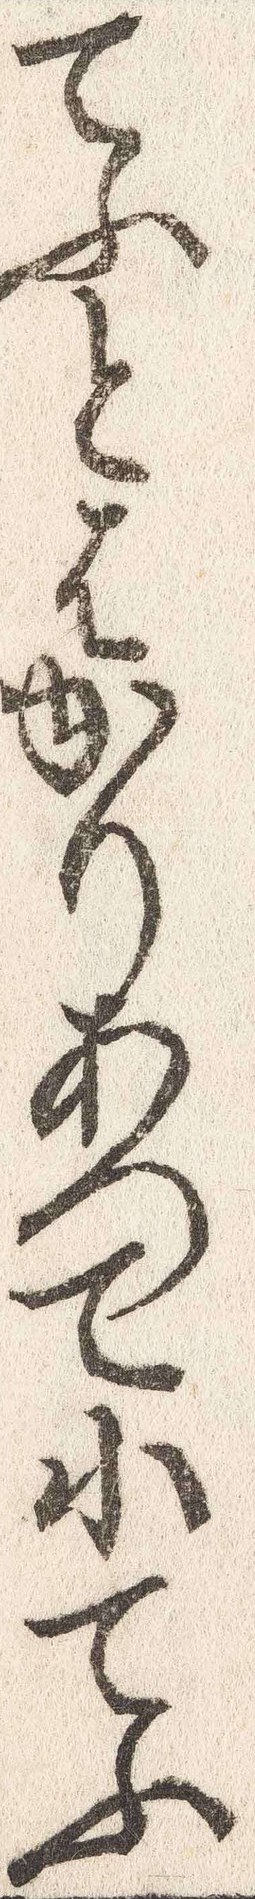てふとはかりあつて小てふ
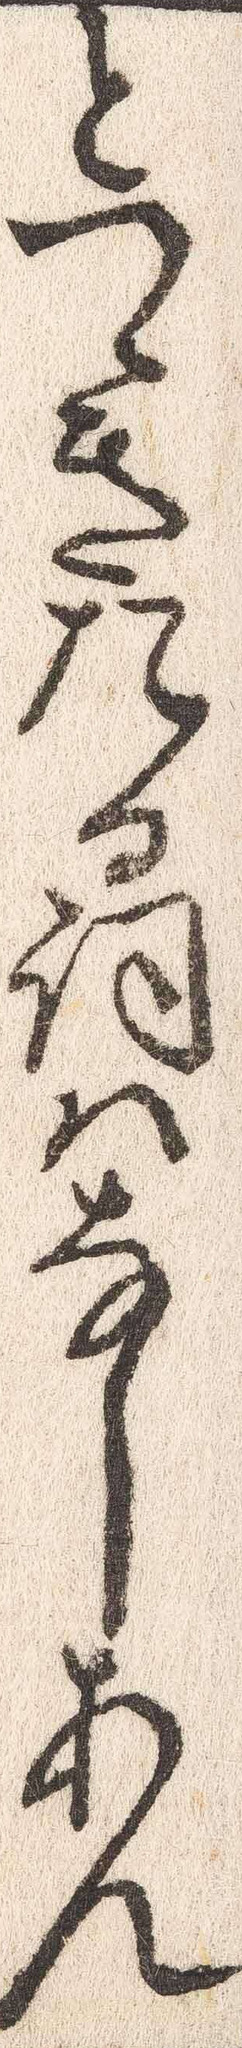とつゝきたる詞はなしあん
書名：源氏物語
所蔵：東京学芸大学附属図書館 国文学研究資料館
